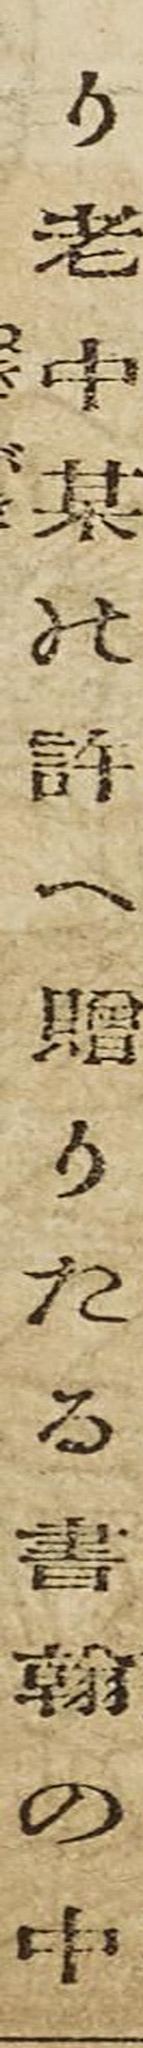り老中某の許へ贈りたる書翰の中
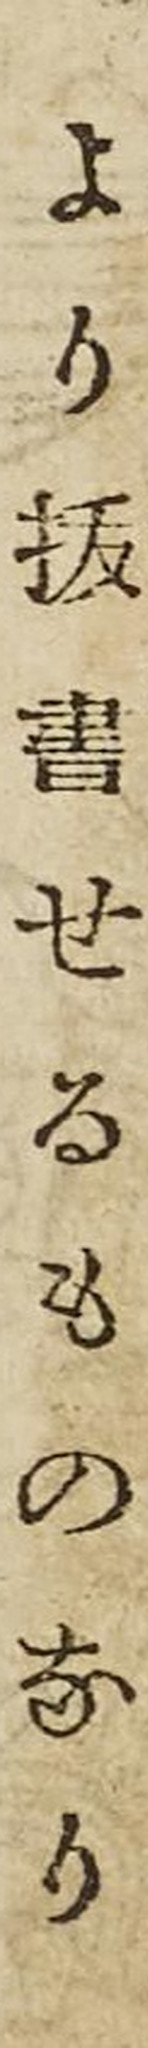より抜書せるものなり
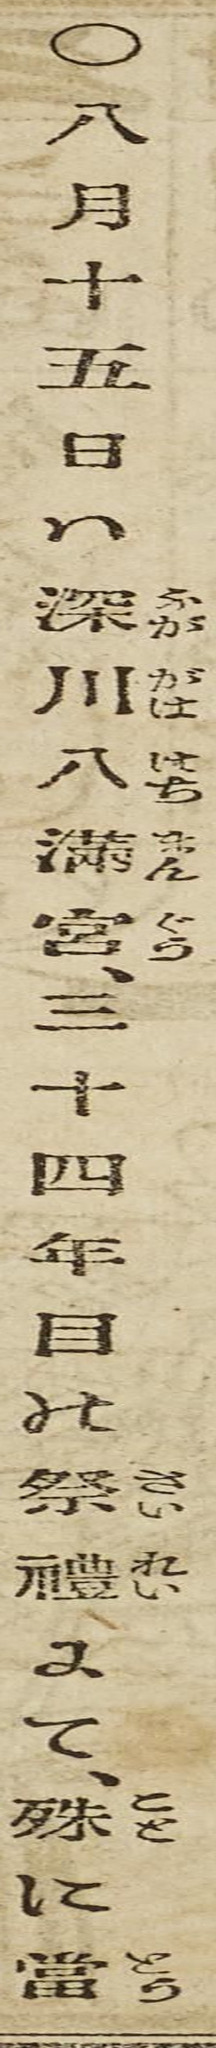〇八月十五日は深川八幡宮、三十四年目の祭礼にて、殊に当
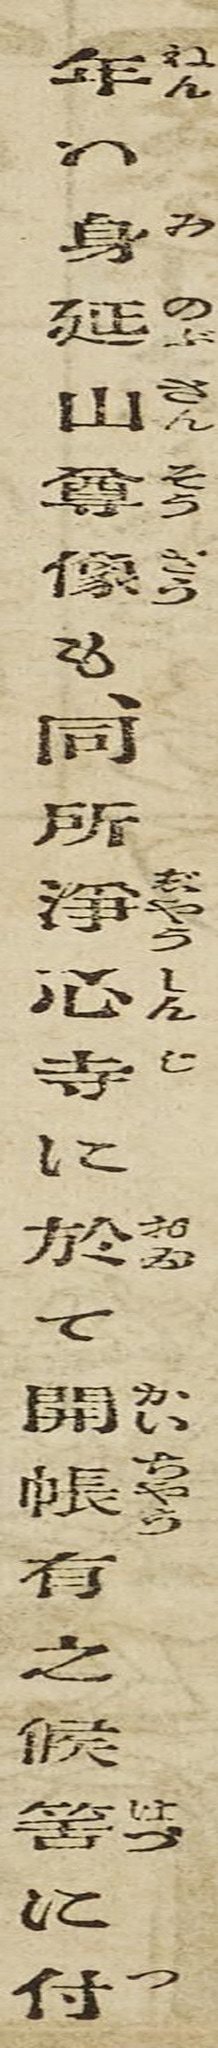年は身延山尊像も、同所浄心寺に於て開帳有之候筈に付
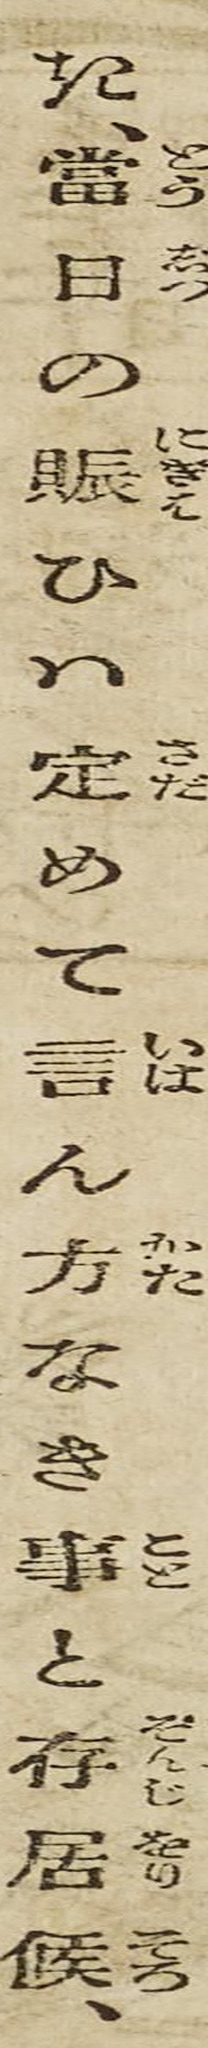き、当日の賑ひは定めて言ん方なき事と存居候、
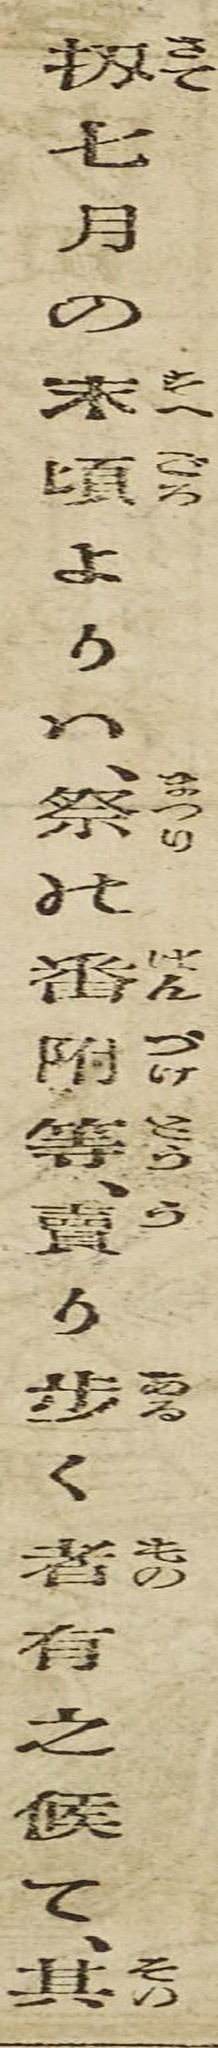扨七月の末頃よりは、祭の番附等、売り歩く者有之候て、其
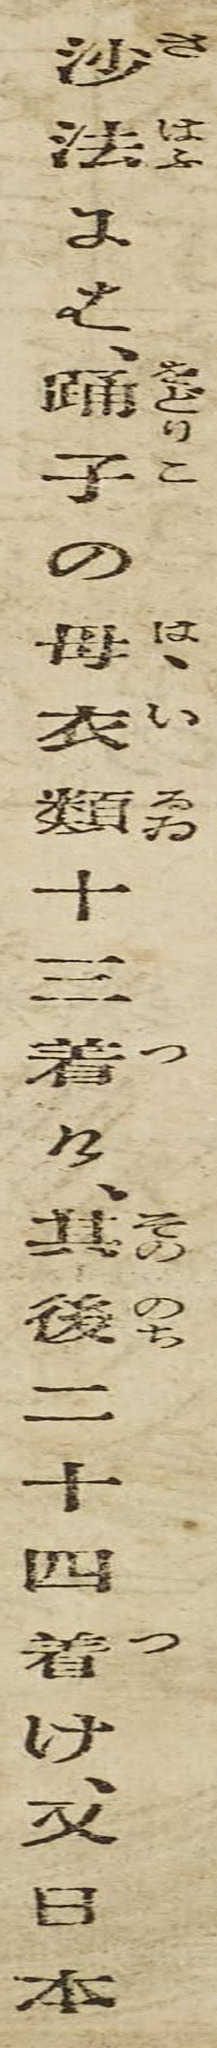沙法には、踊子の母衣類十三着け、其後二十四着け、又日本
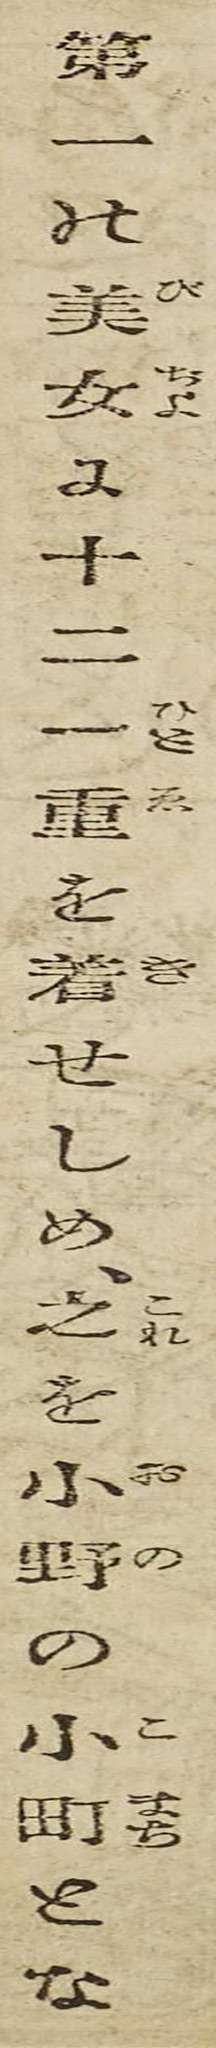第一の美女に十二一重を着せしめ、之を小野の小町とな
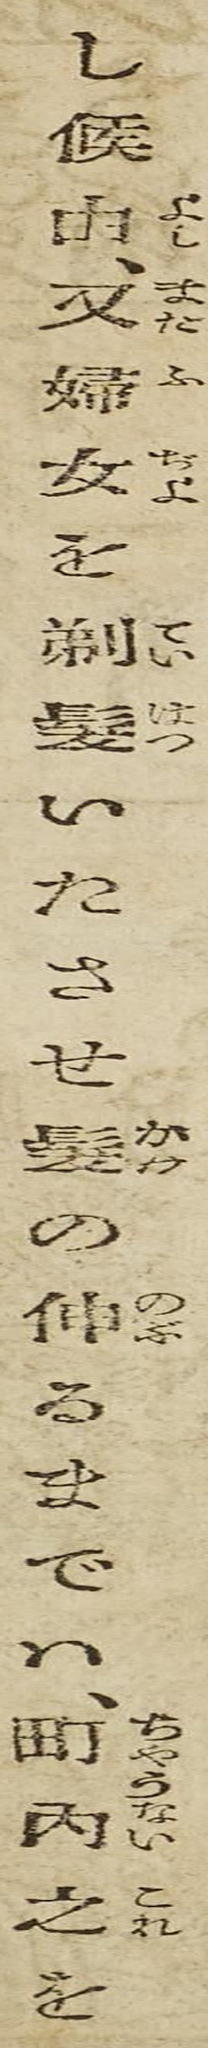し候由、又婦女を剃髪いたさせ髪の伸るまでは、町内之を
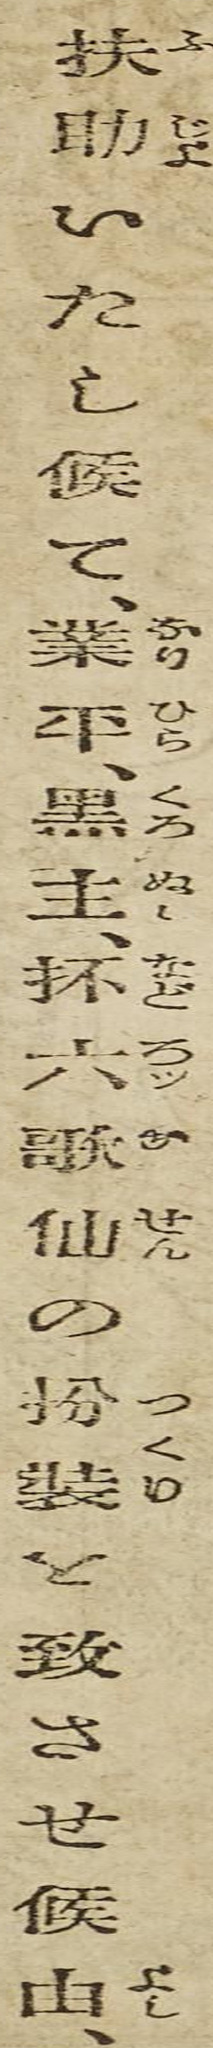扶助いたし候て、業平、黒主、抔六歌仙の扮装を致させ候由、

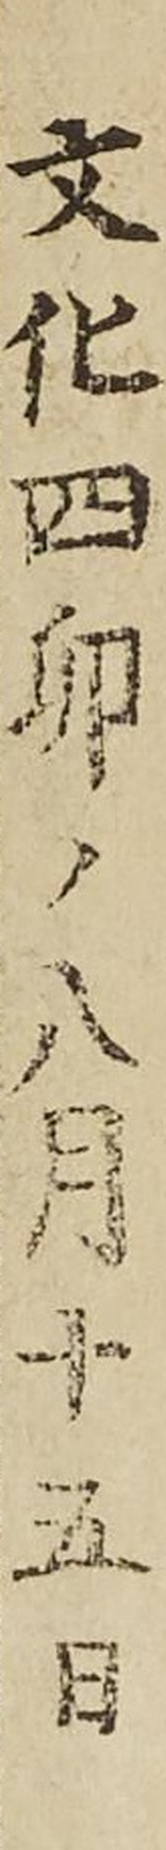文化四卯ノ八月十五日
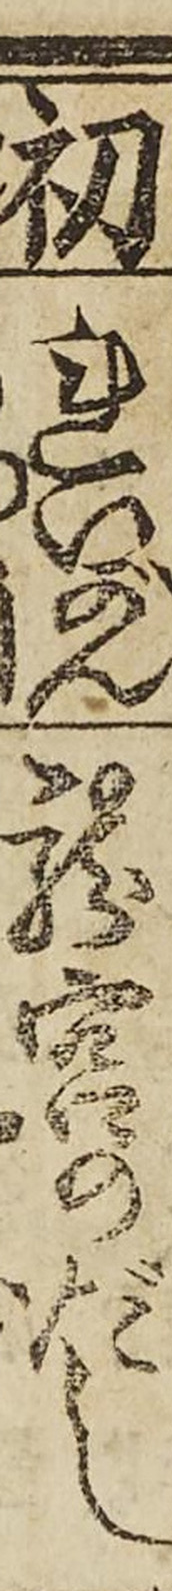初れいがん竜宮のだし
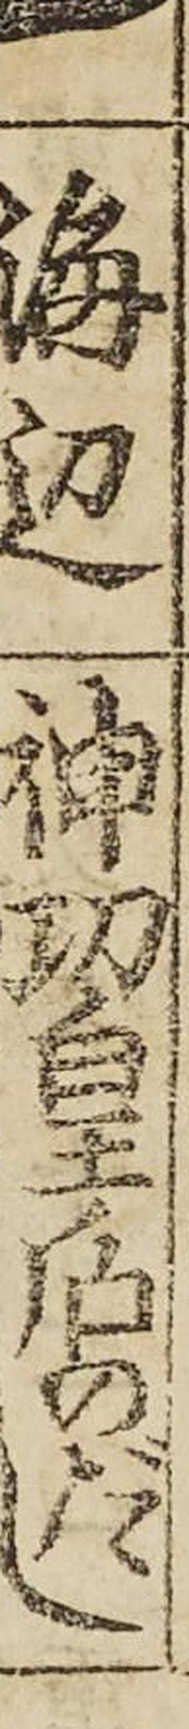一海辺神功皇后のだし
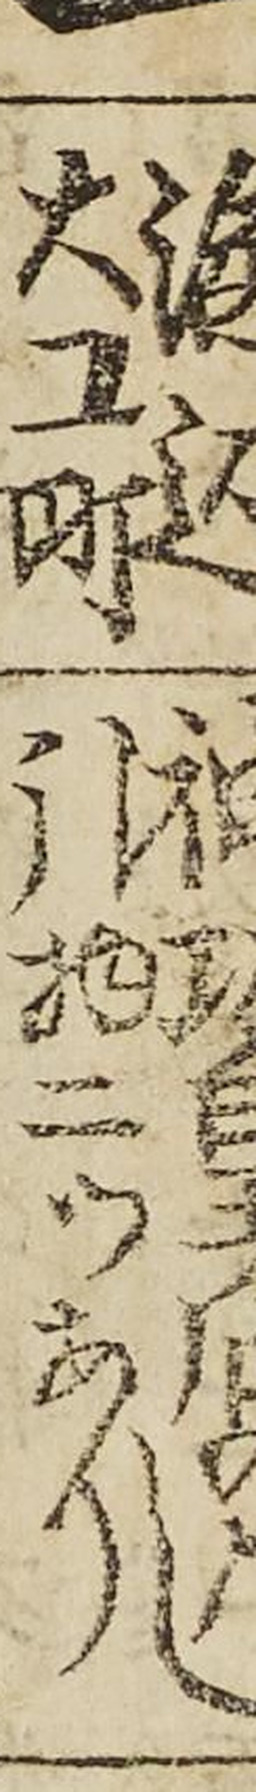大工町引物二ツあり
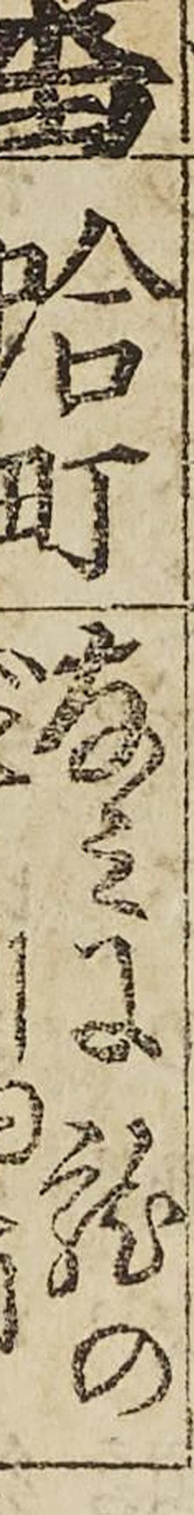番蛤町なみに龍の
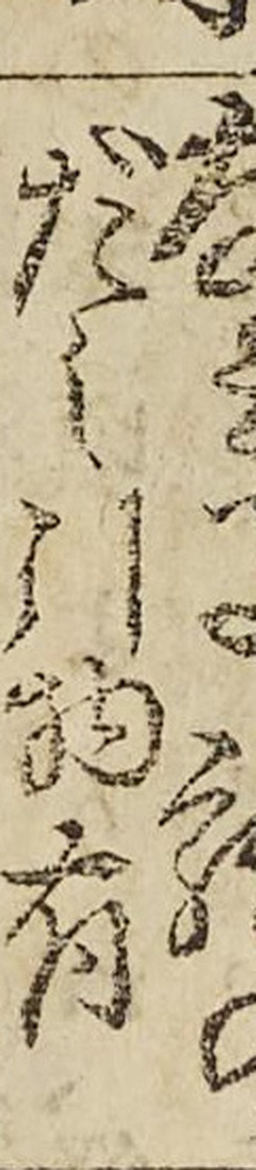だし引物有
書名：永代惨話　文化の夢　全
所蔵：東京大学地震研究所図書室 Earthquake Research Institute Library, The University of Tokyo, JAPAN
